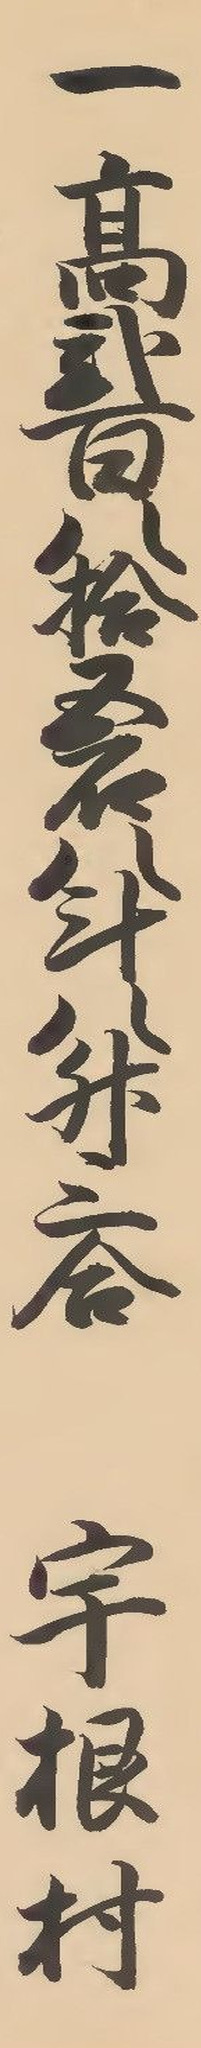一髙弐百八拾五石八斗八升三合宇根村
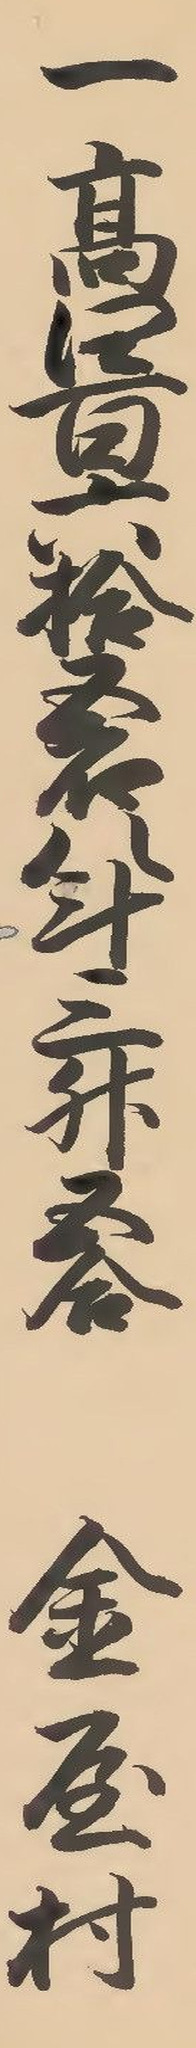一髙四百六拾五石八斗三升五合金屋村
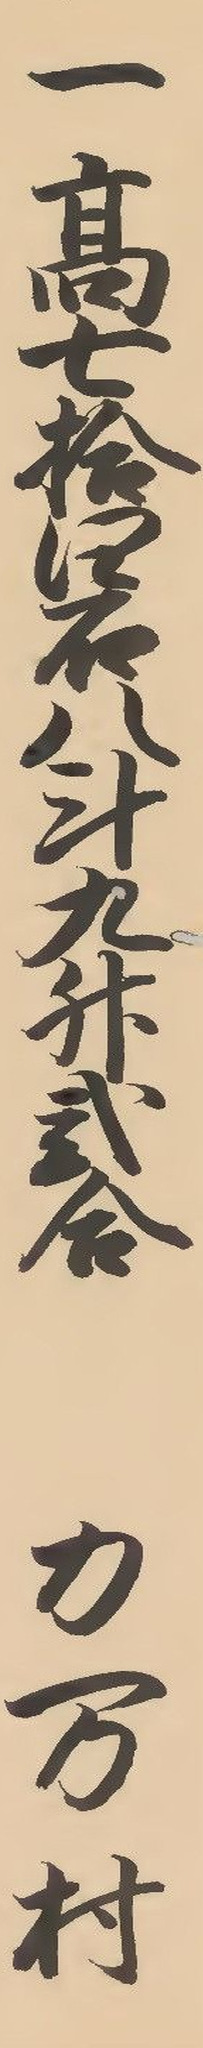一髙七拾四石八斗九升弐合力万村
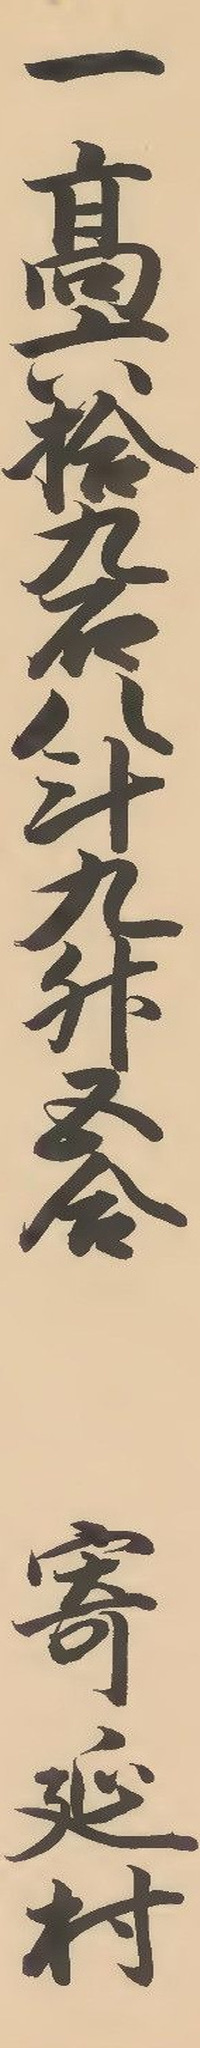一髙六拾九石八斗九升五合寄延村
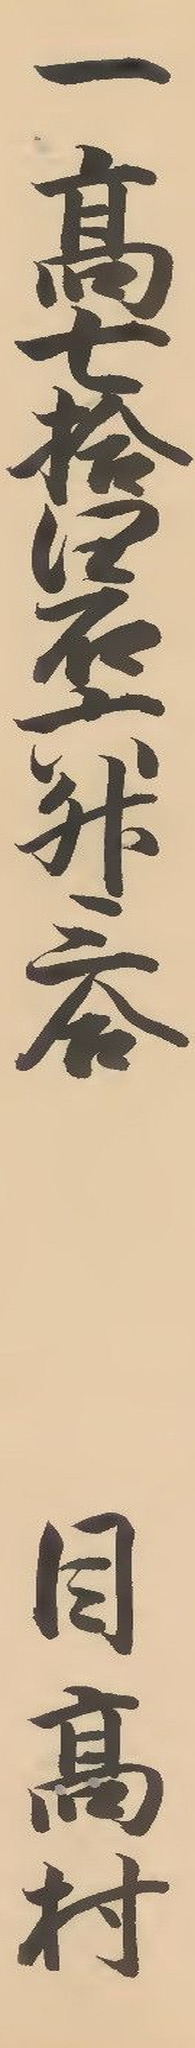一髙七拾四石六升三合目髙村
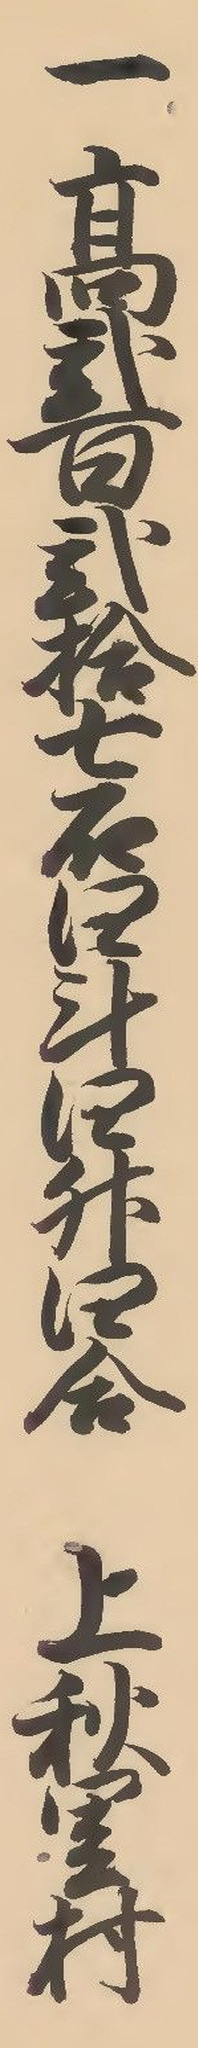一髙弐百弐拾七石四斗四升四合上秋里村

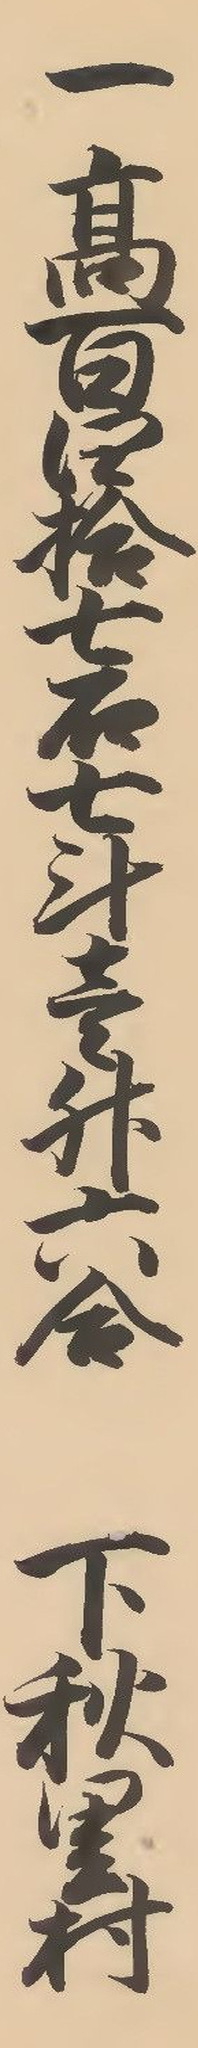一髙百四拾七石七斗壱升六合下秋里村
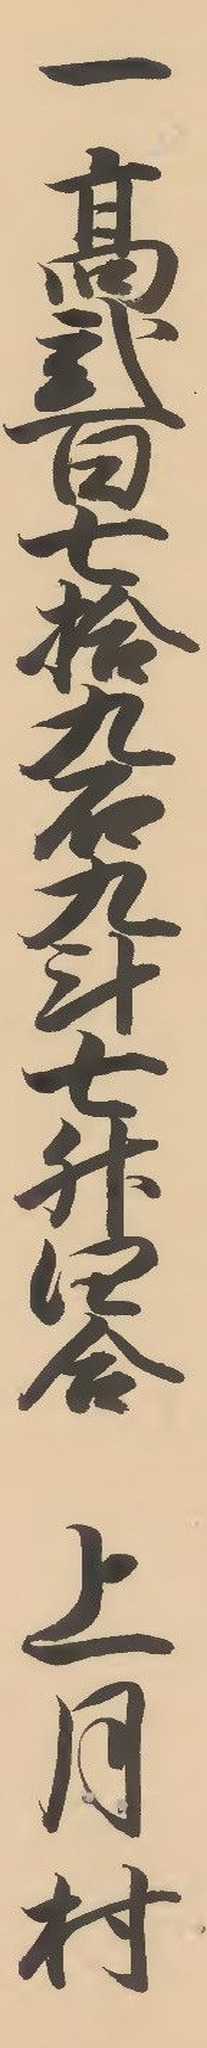一髙弐百七拾九石九斗七升四合上月村
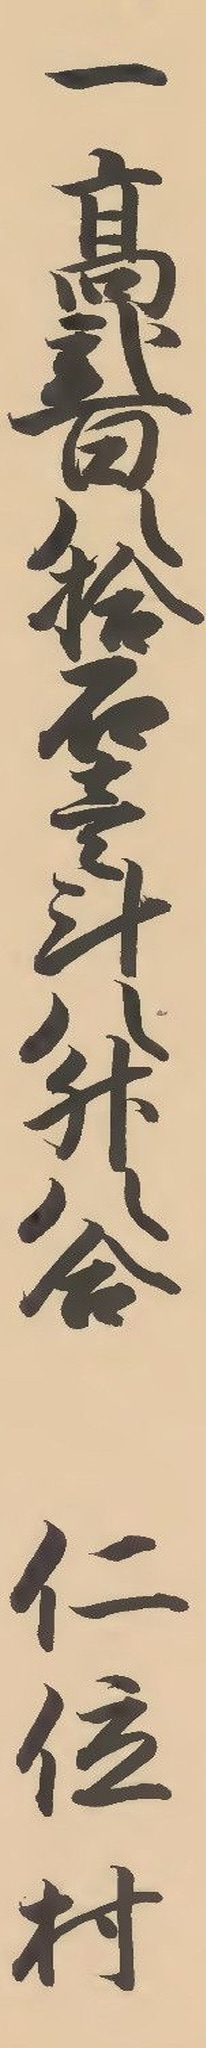一髙弐百八拾石壱斗八升八合仁位村
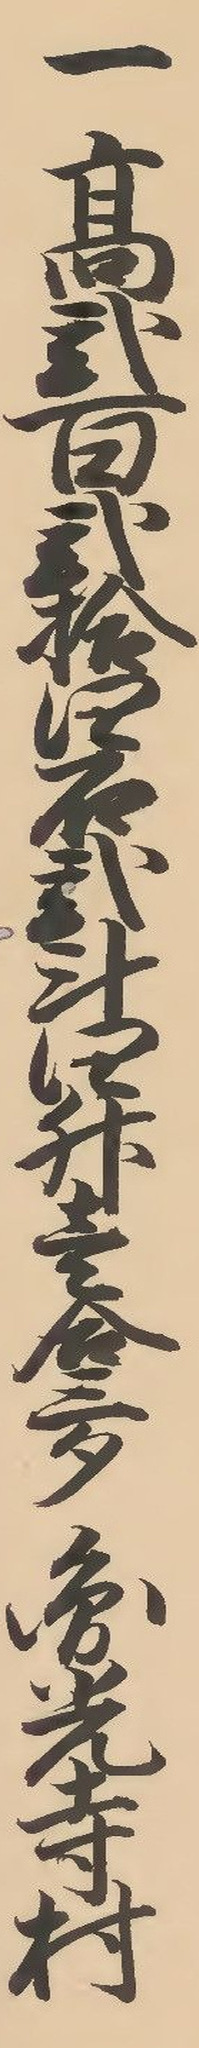一髙弐百弐拾四石弐斗四升壱合三夕圓光寺村
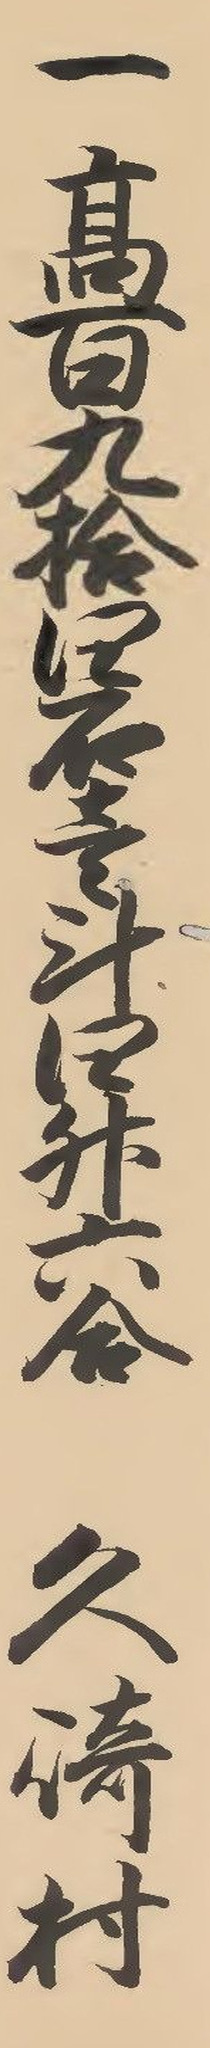一髙百九拾四石壱斗四升六合久崎村
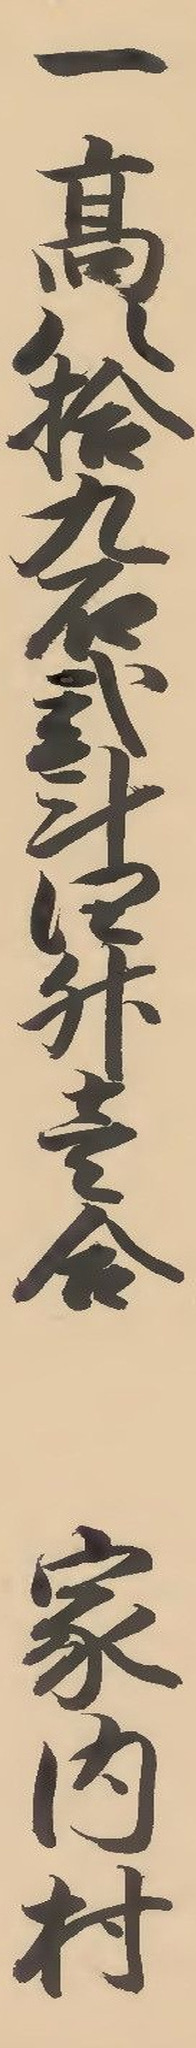一髙八拾九石弐斗四升壱合家内村
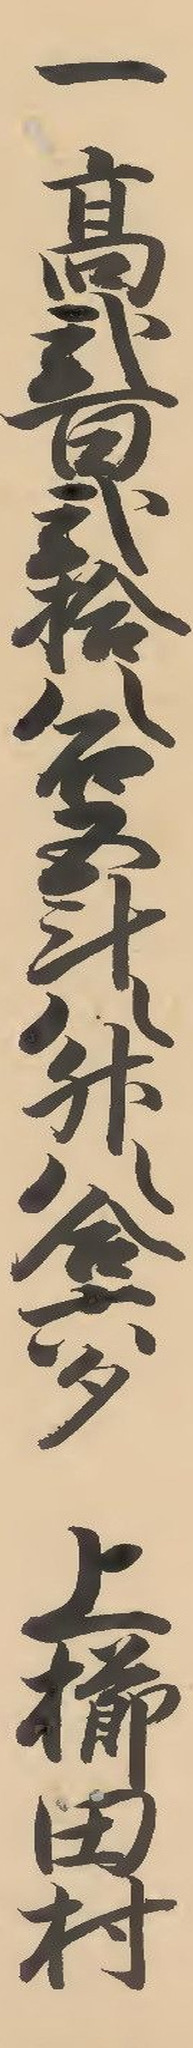一髙弐百弐拾八石五斗八升八合六夕上櫛田村
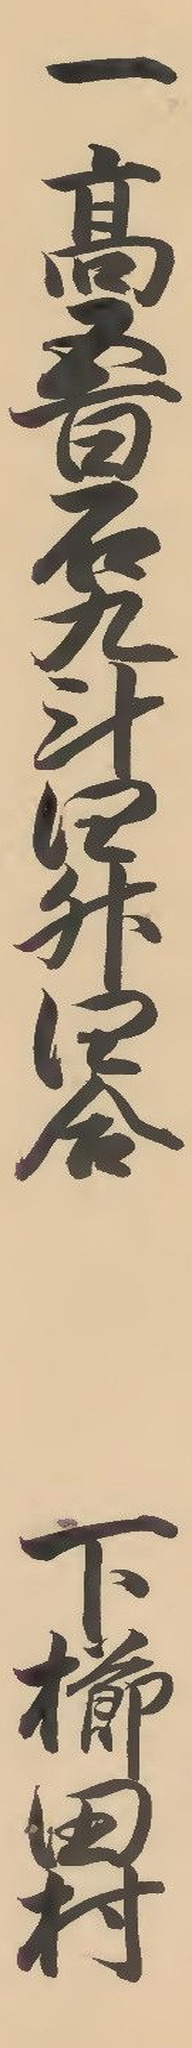一髙五百石九斗四升四合下櫛田村

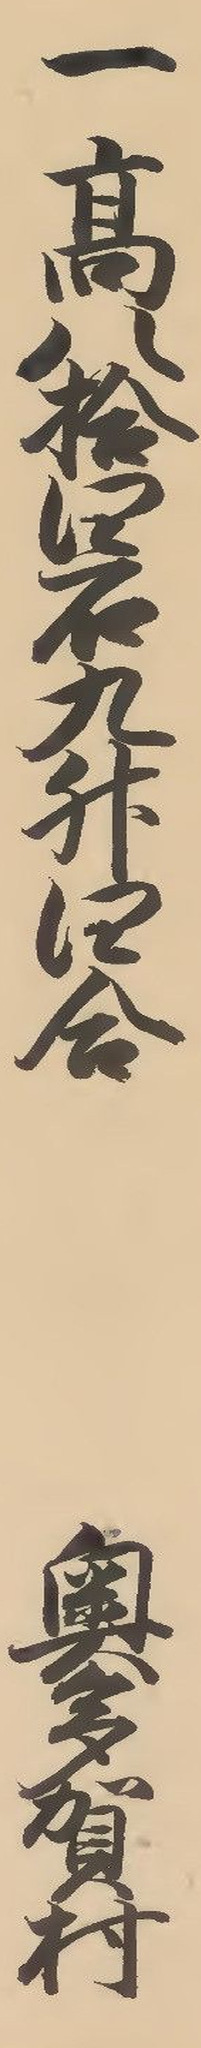一髙八拾四石九升四合奥多賀村
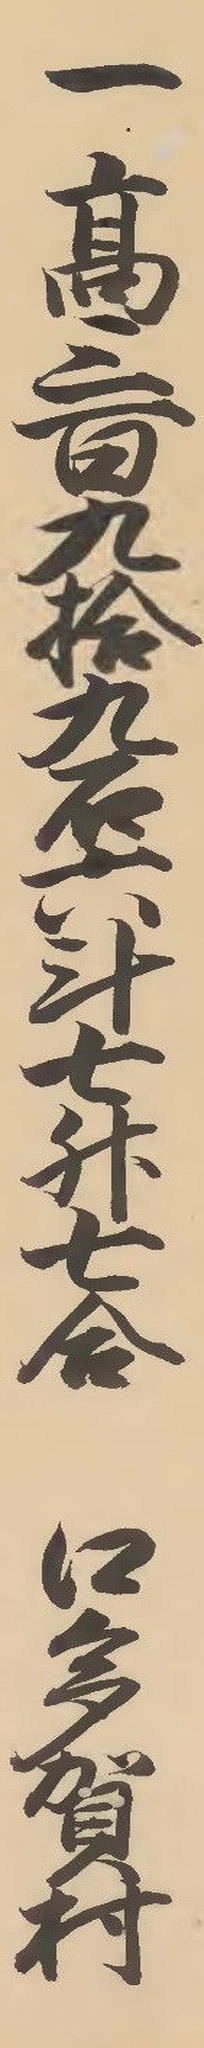一髙三百九拾九石六斗七升七合口多賀村
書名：播磨国郷帳
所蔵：国立公文書館 National Archives of Japan
